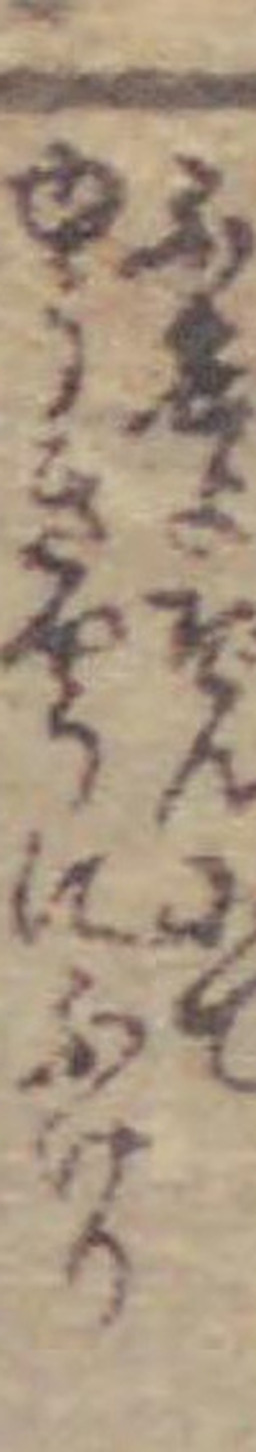ゆうきやうにふけり
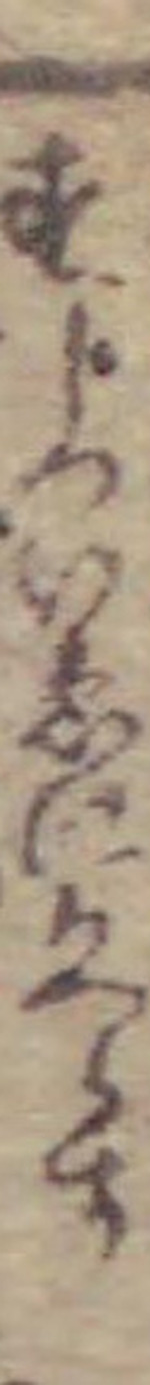すじついゑにかへらす
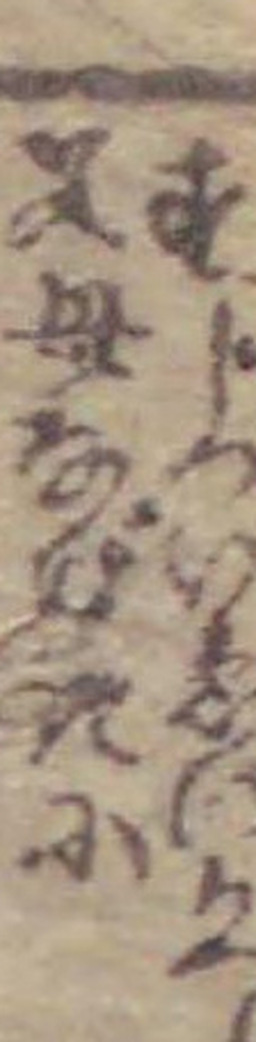父母なげきに
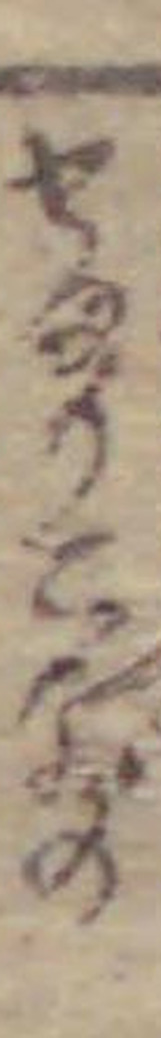せまりこんゐの
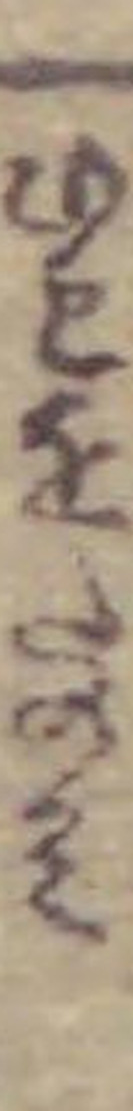ひとをたのみ
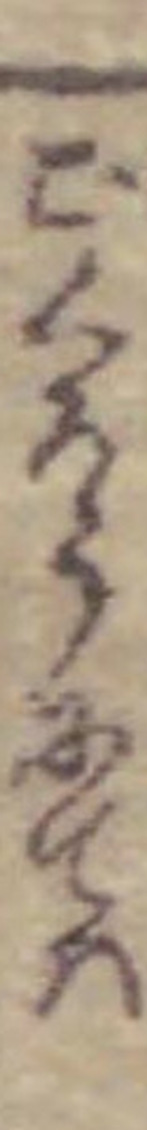ごくろうにては
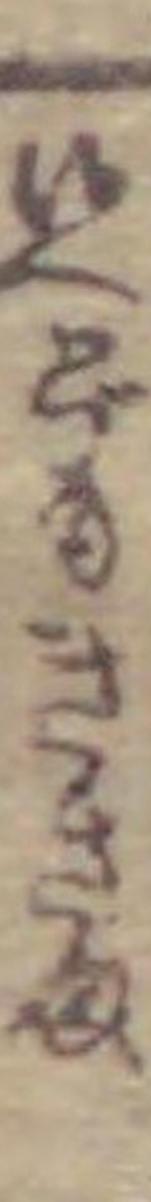候へどもきさま
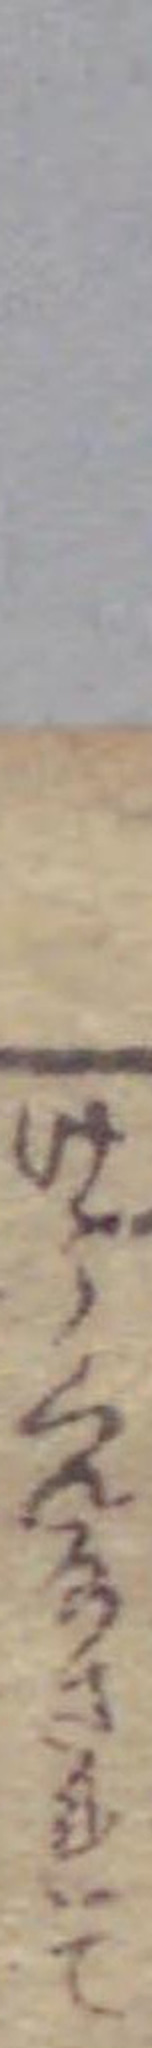けうくんなされて
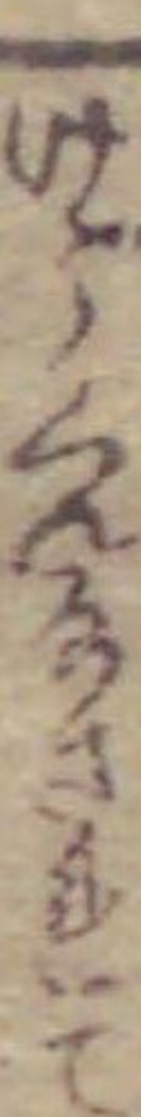けうくんなされて
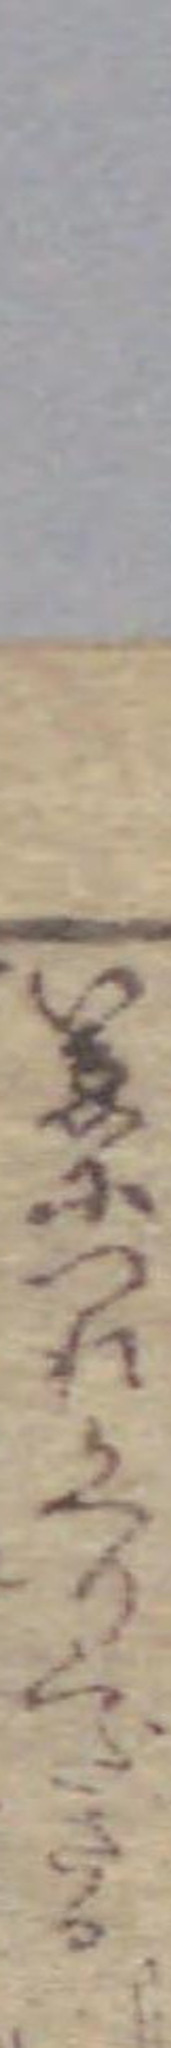いゑにつれかへりくださる
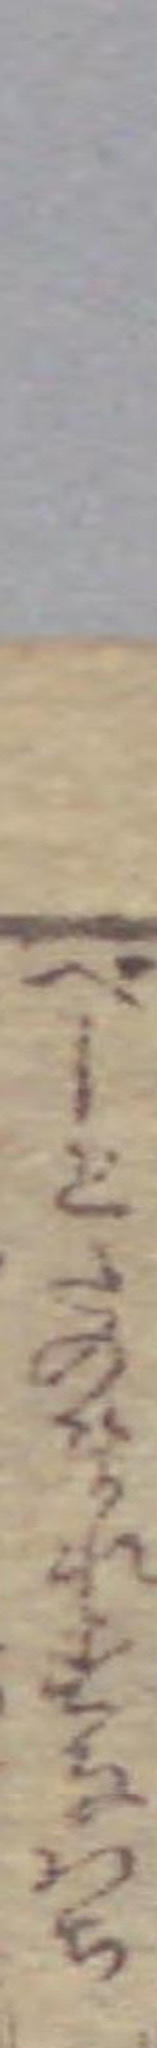べしとたのまれすなわち
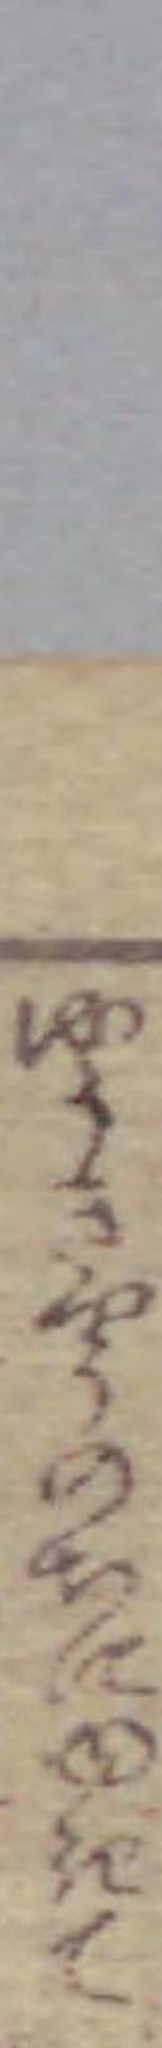ゆうきやうのちにゆきて
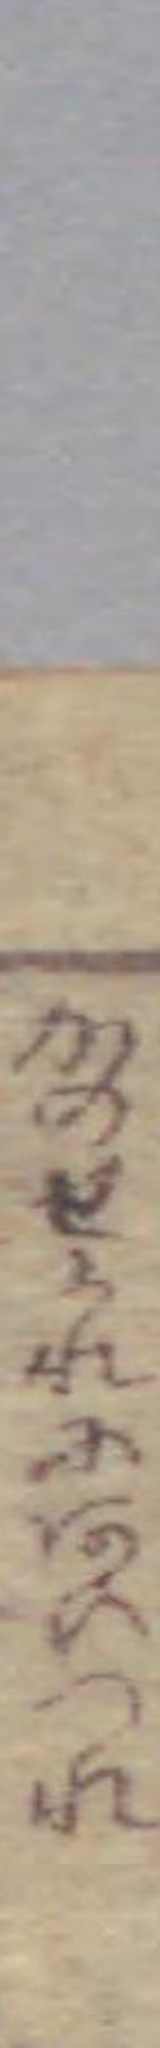かのせかれにあいつれ
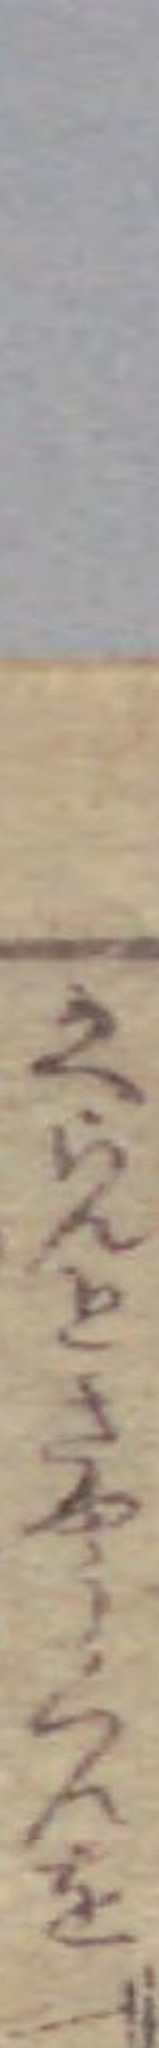かへらんときやうくんを
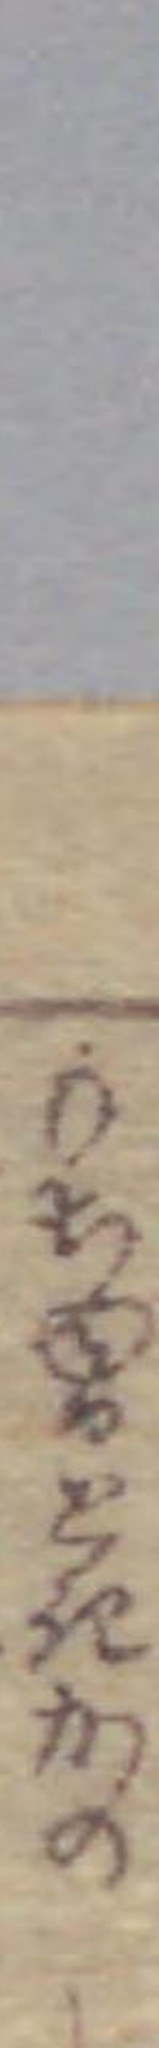もちゆるときかの
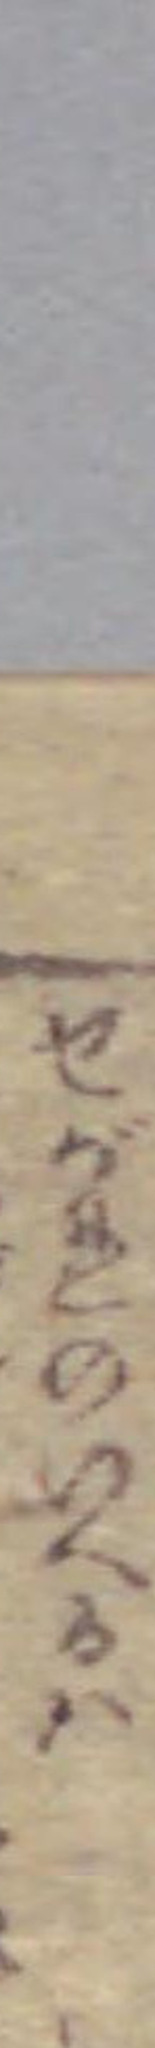せがれのいへるは
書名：化物和本草 : 3巻
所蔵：国立国会図書館 National Diet Library, JAPAN
